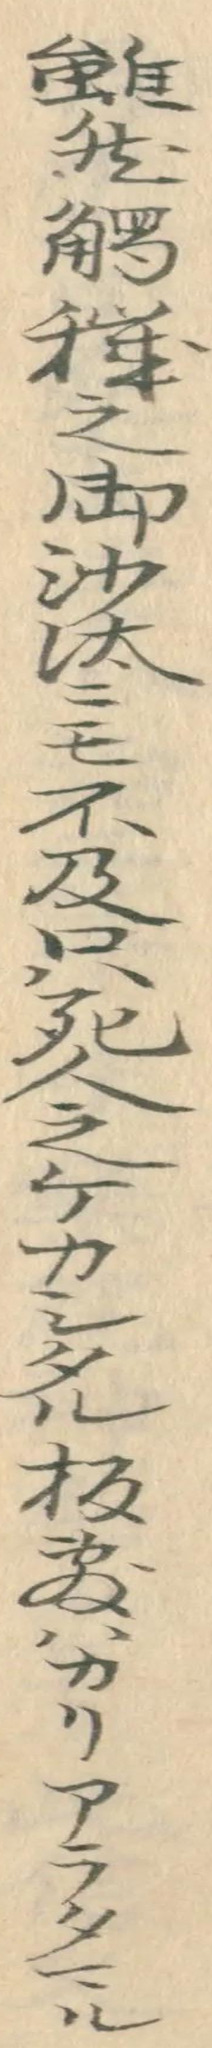雖然触穢之御沙汰ニモ不及只死人之ケカシタル板敷ハカリアラタマル

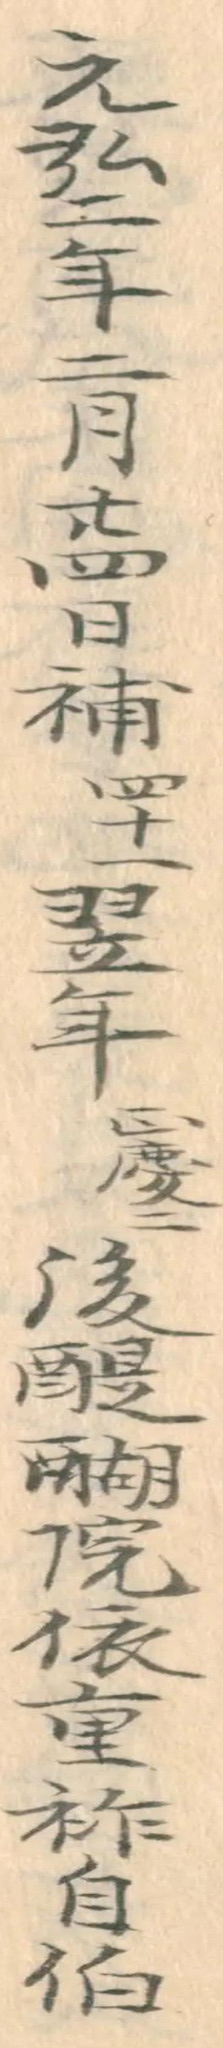元弘二年二月廿四日補四十一丑年正慶三後醍醐院依重祚自伯
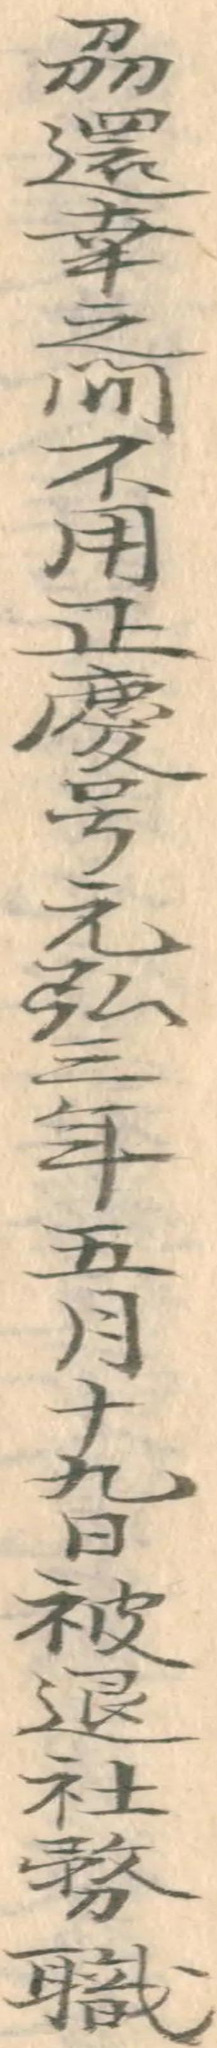州還幸之間不用正慶号元弘三年五月十九日被退社務職
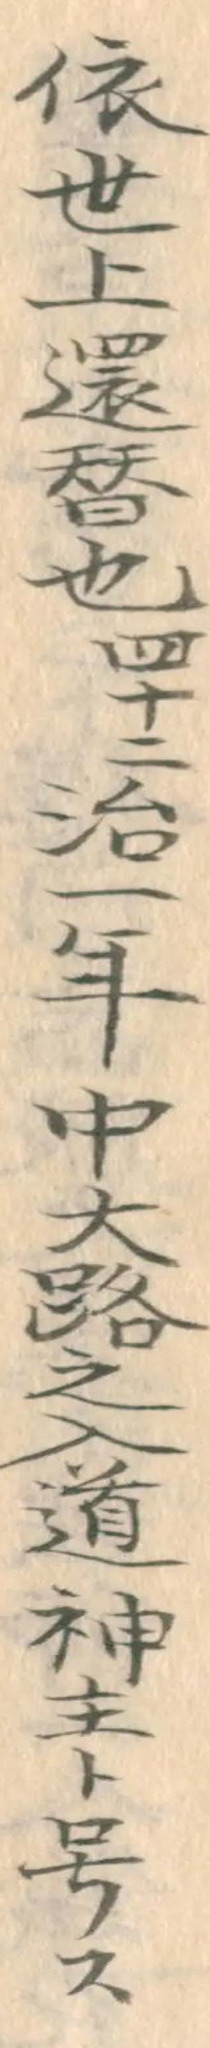依世上還替也四十二治一年中大路之入道神主ト号ス
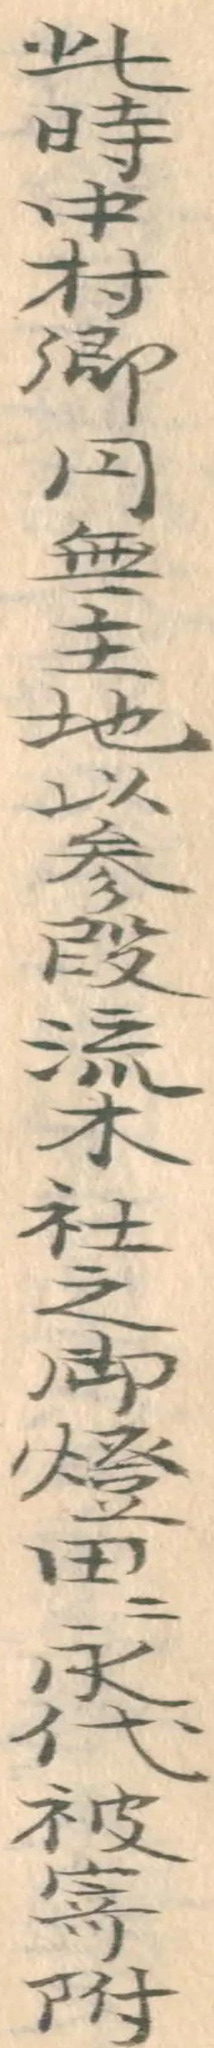此時中村卿円無主地以参段流木社之御燈田ニ永代被寄附
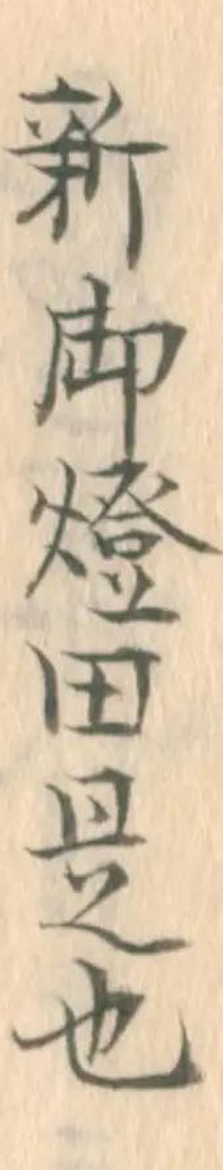新御燈田是也
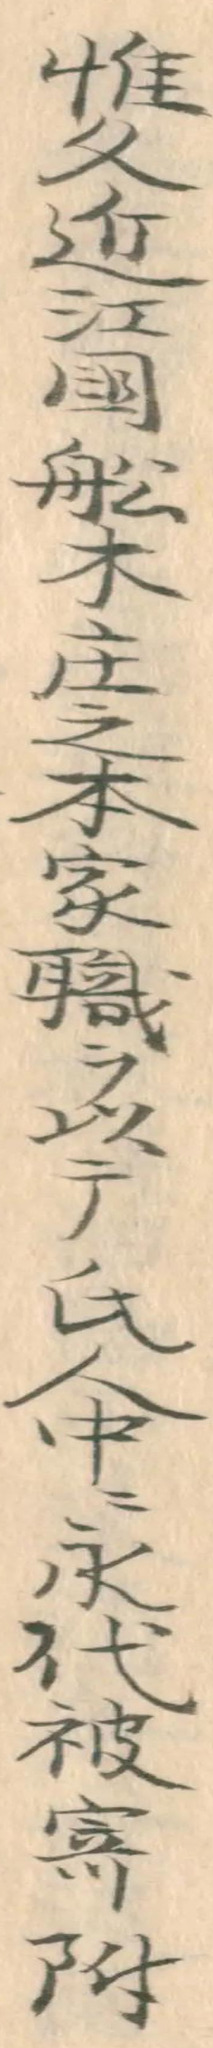惟久近江国船木庄之本家職ヲ以テ氏人中ニ永代被寄附
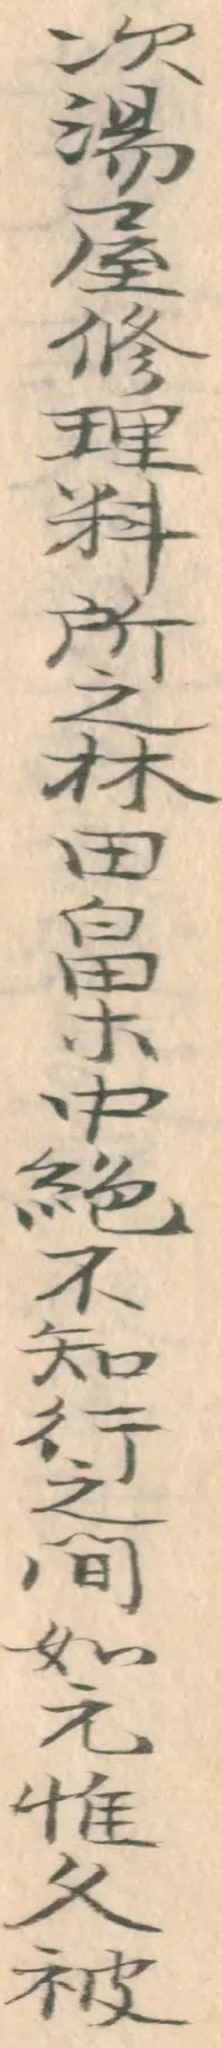次湯屋修理料所之林田畠等中絶不知行之間如元惟久被
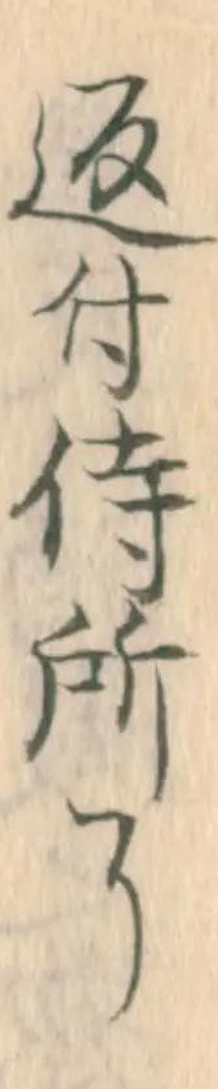返付侍所了
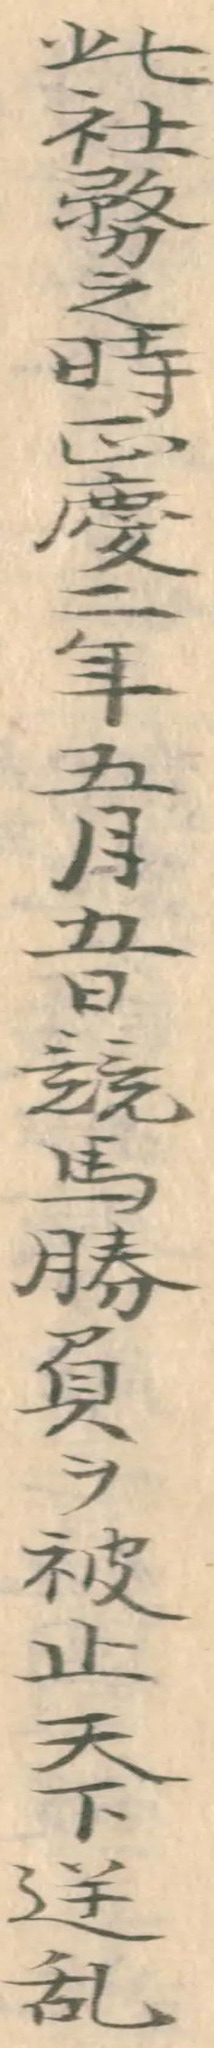此社務之時正慶二年五月五日競馬勝負ヲ被止天下逆乱
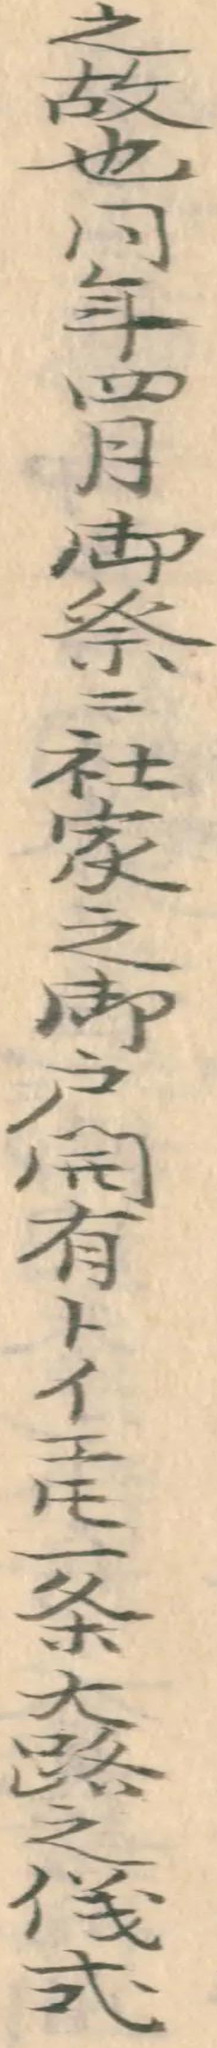之故也同年四月御祭ニ社家之御戸開有トイエトモ一条大路之儀式
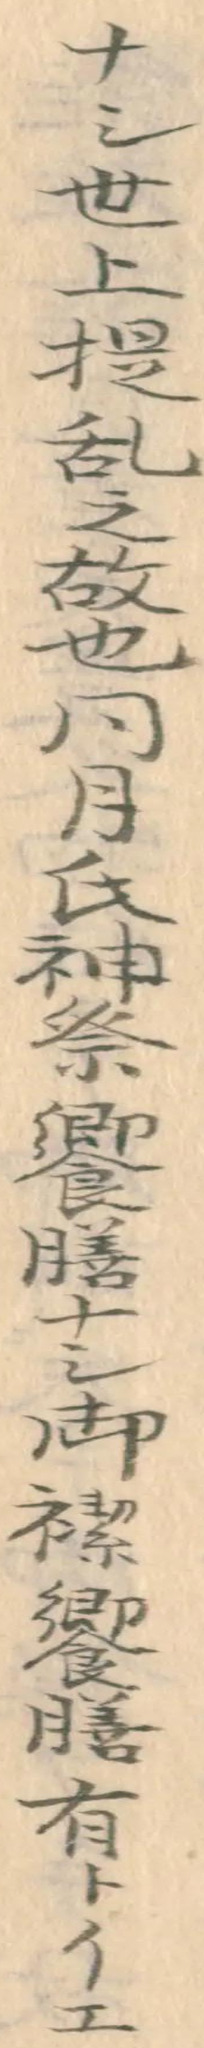ナシ世上提乱之故也同月氏神祭饗膳ナシ御饗膳有トイエ
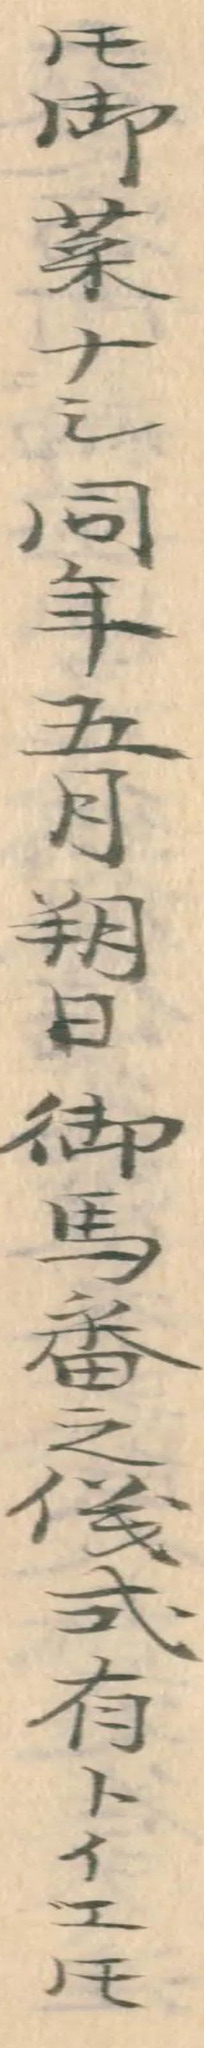トモ御菜ナシ同年五月朔日御馬番之儀式有トイエトモ
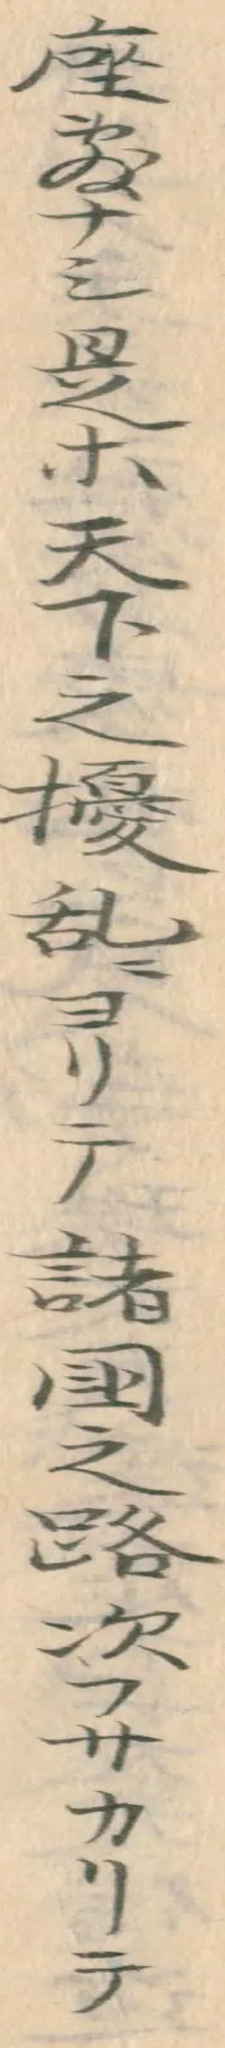座敷ナシ是等天下之擾乱ニヨリテ諸国之路次フサカリテ
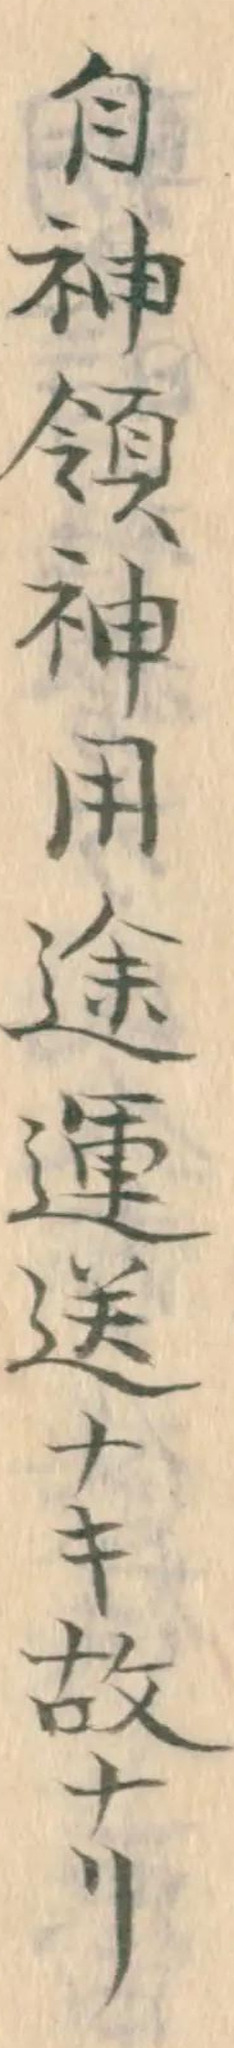自神領神用途運送ナキ故ナリ
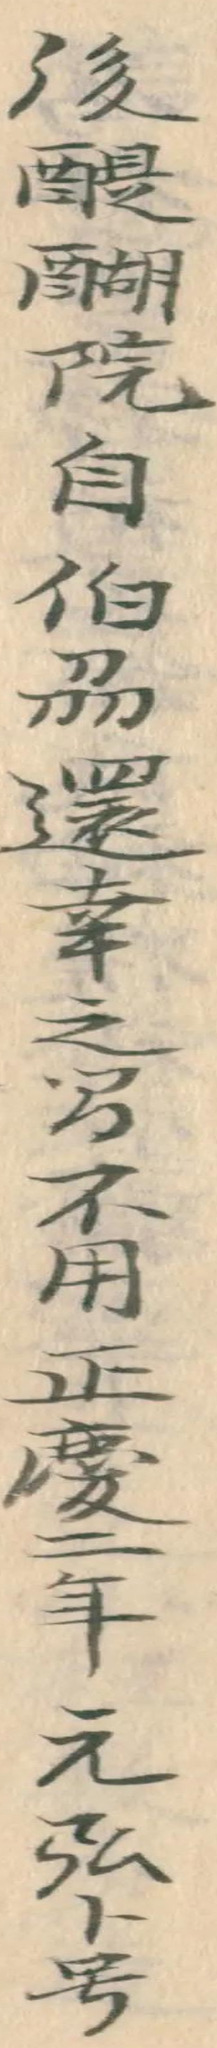後醍醐院自伯州還幸之間不用正慶二年元弘ト号
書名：賀茂社記録. 第24冊
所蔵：国立国会図書館 National Diet Library, JAPAN
